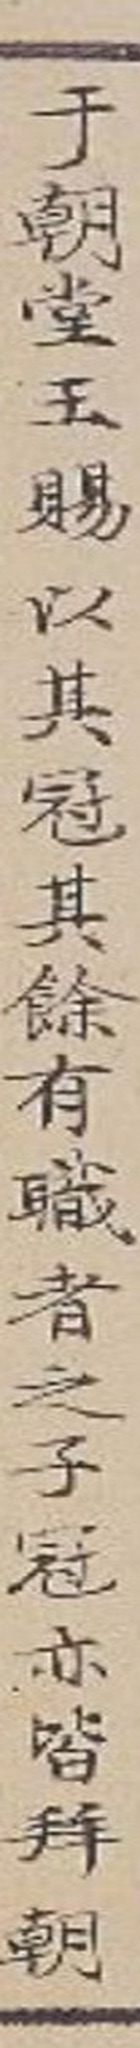于朝堂王賜以其冠其余有職者之子冠亦皆拝朝
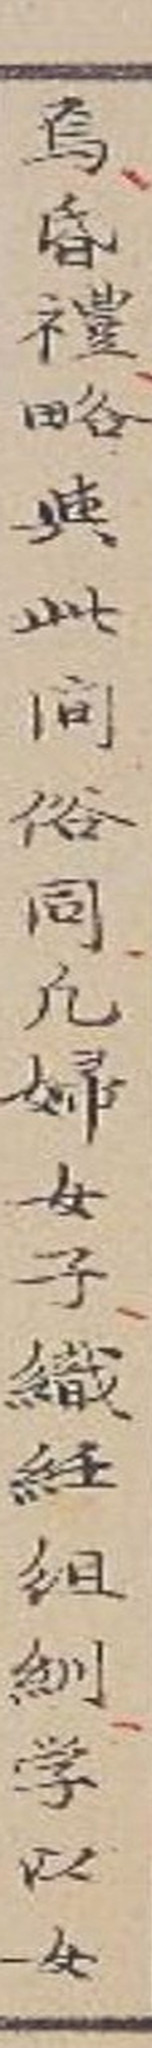焉、昏礼、略与此間俗同、凡婦女子、織紝組紃、学以女
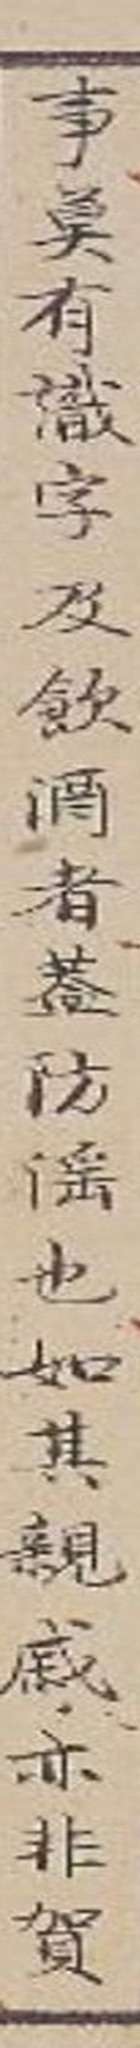事、莫有識字及飲酒者、蓋防謡也、如其親戚、亦非賀
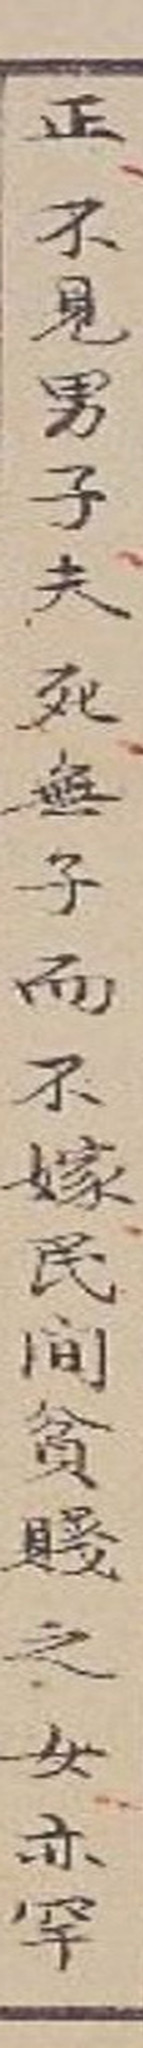正、不見男子、夫死、無子而不嫁、民間貧賤之女、亦罕
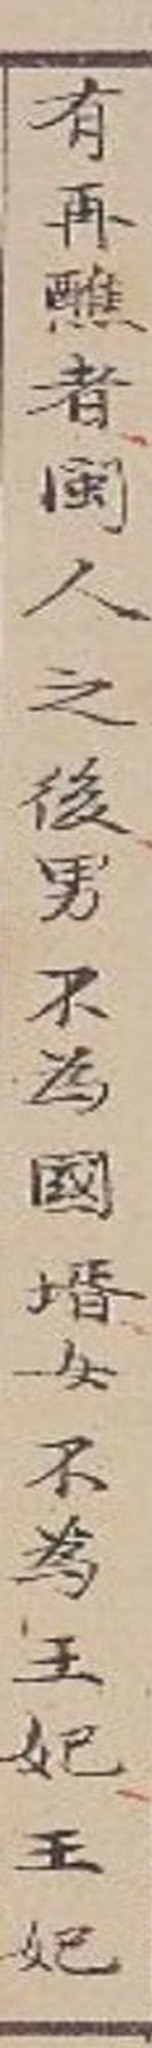有再醮者、閩人之後、男不為国壻、女不為王妃、王妃
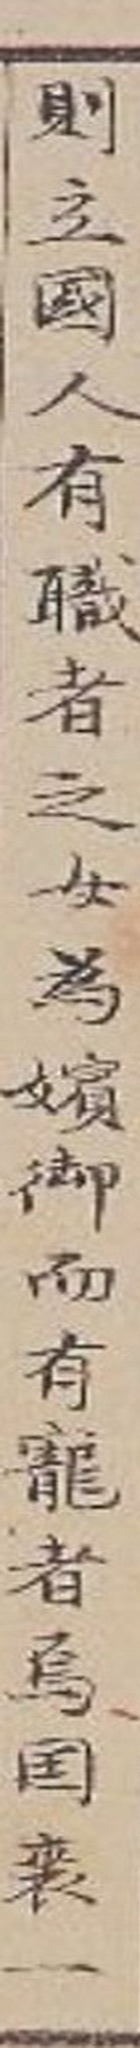則立国人有職者之女為嬪御而有寵者焉、国喪一
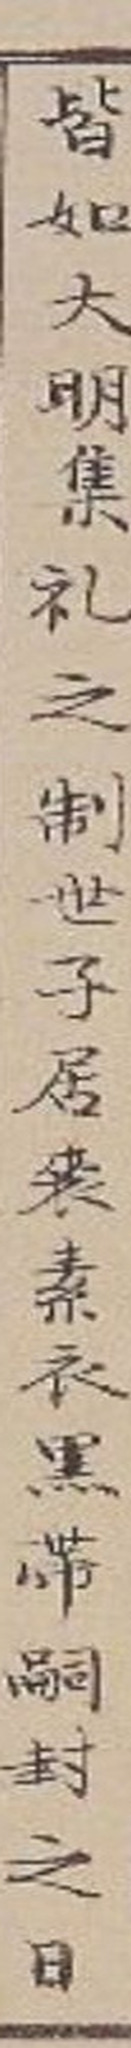皆如大明集礼之制世子居喪素衣黒帯嗣封之日
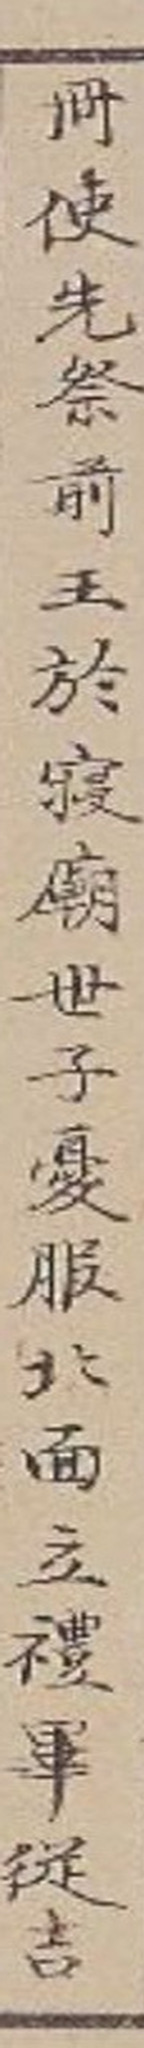冊使先祭前王於寝廟世子憂服北面立礼畢従吉
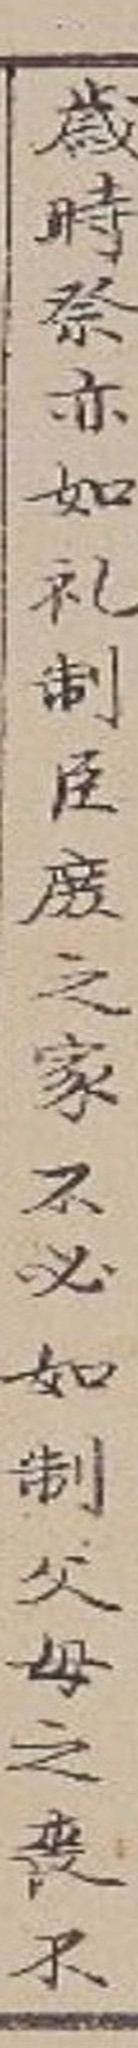歳時祭亦如礼制臣庶之家不必如制父母之喪不
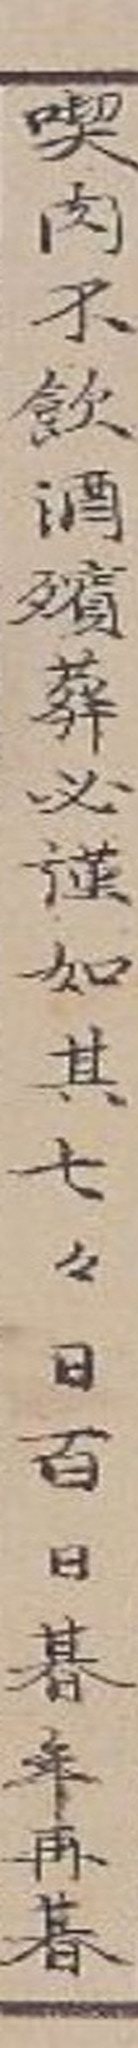喫肉不飲酒殯葬必謹如其七々日百日暮年再暮

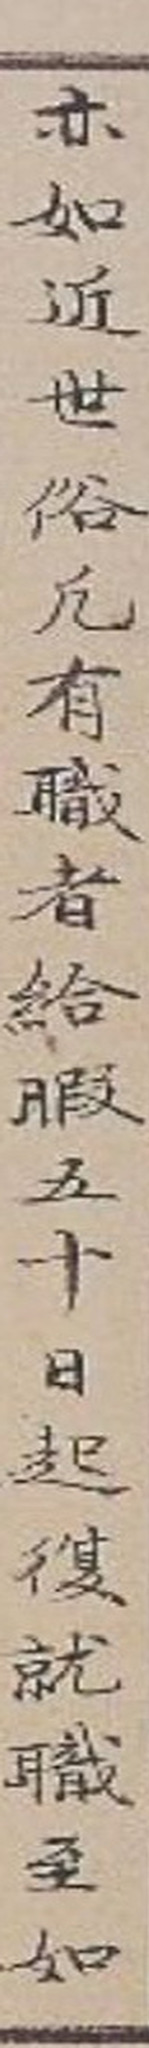亦如近世俗凡有職者給暇五十日起復就職至如
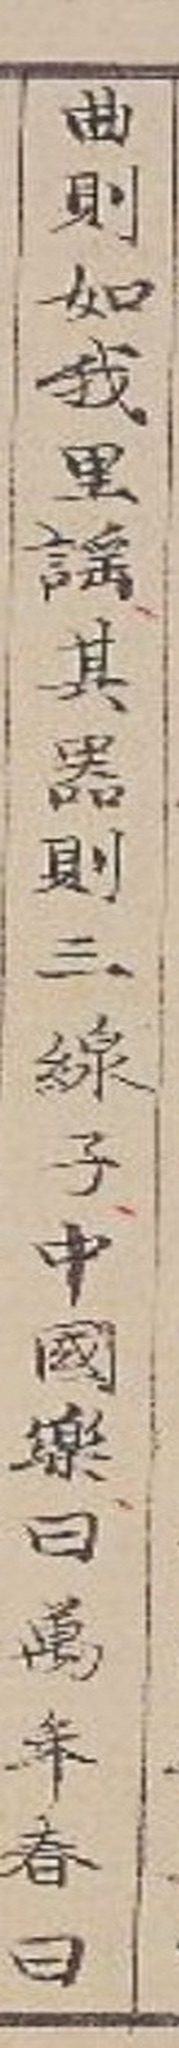曲則如我里謡、其器則三線子、中国楽、曰万事春曰
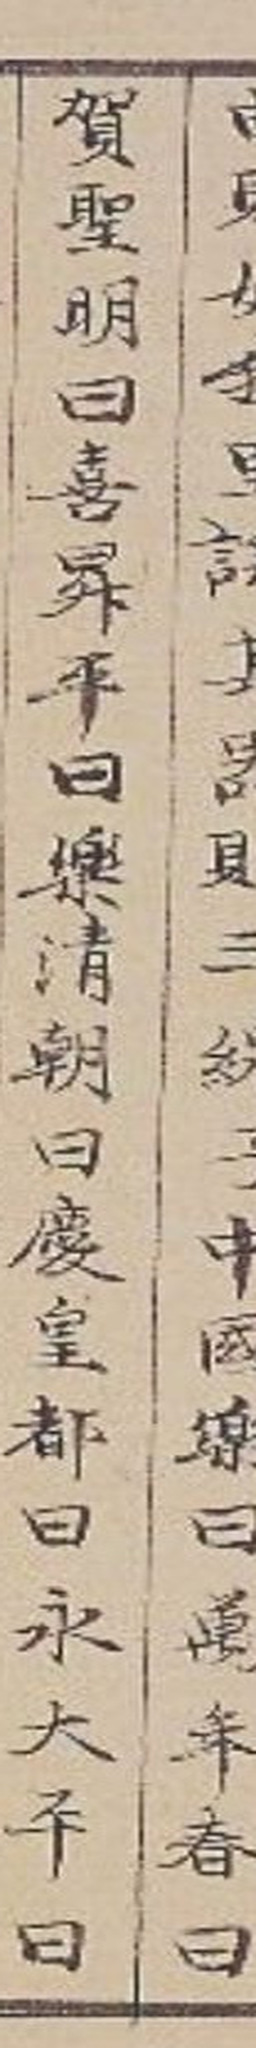賀聖明曰喜昇平曰楽清朝曰慶皇都曰永大平曰
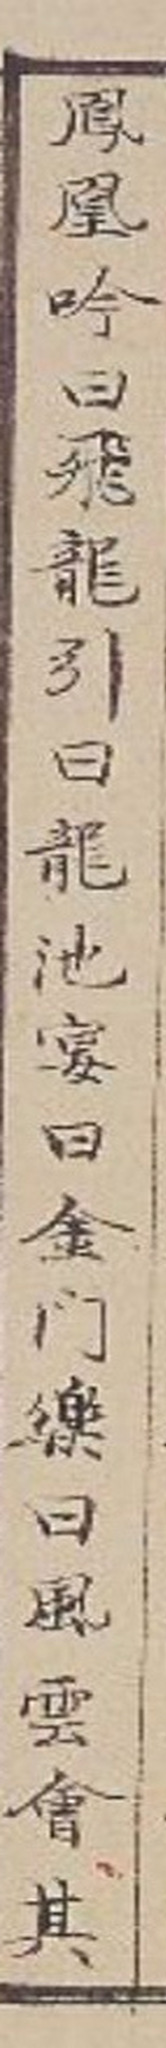鳳凰吟曰飛竜引曰竜池宴曰金門楽曰風雲会、其
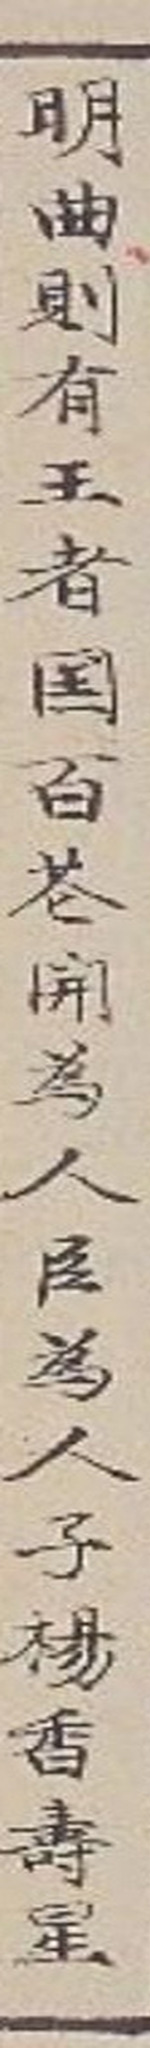明曲、則有王者国百花開為人臣為人子楊香寿星
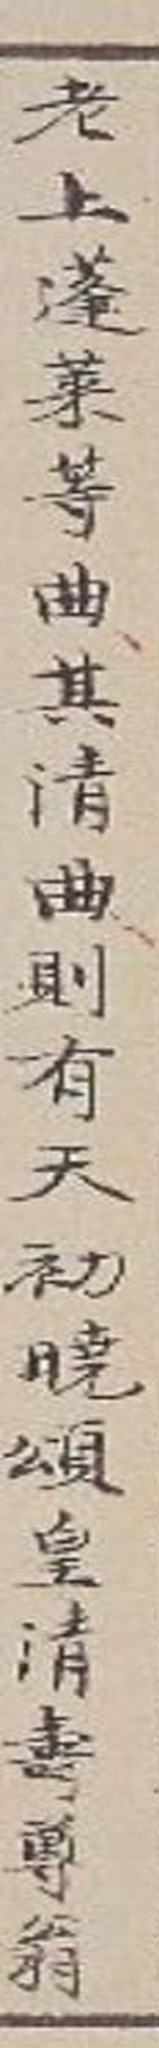老上蓬莱等曲、其清曲、則有天初曉頌皇清寿尊翁
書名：南島志 全
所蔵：University of the Ryukyus Library
